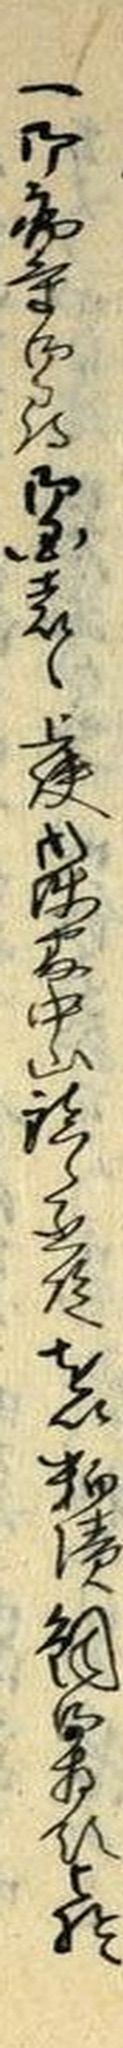一御病気御尋御国表へ上使御使番中山鎮之丞殿を以糟漬鯛御拝領被遊候
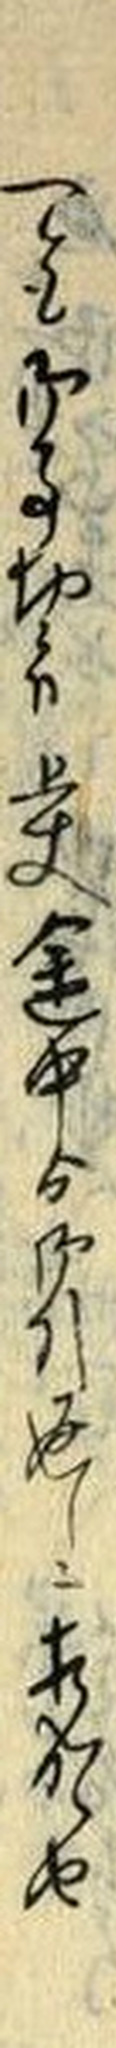へとも御事切ニ付上使途中ゟ御引返しニ相成候由
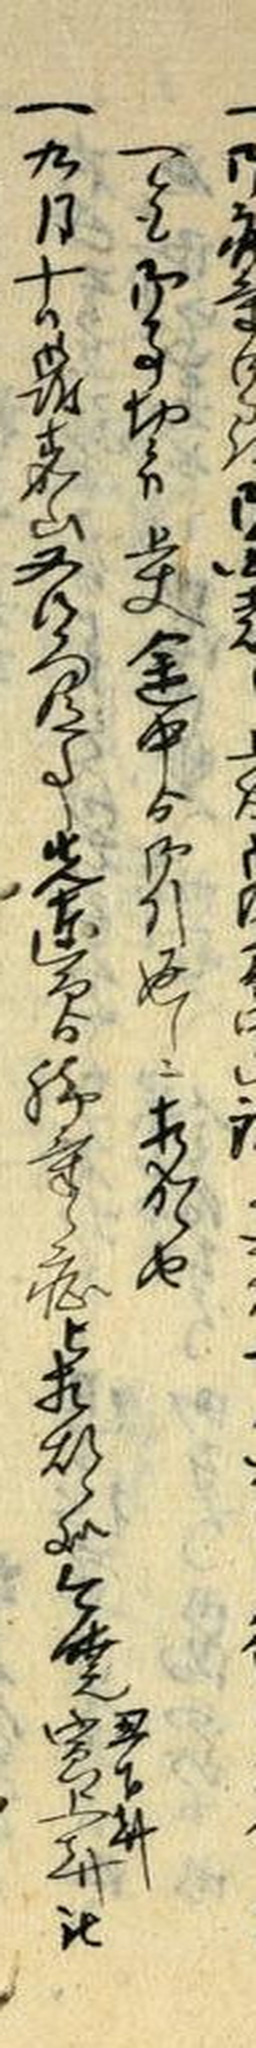一九月十日御附森山又左衛門殿事先達而ゟ脚気之症被相煩候処今暁丑下外刻寅上刻被
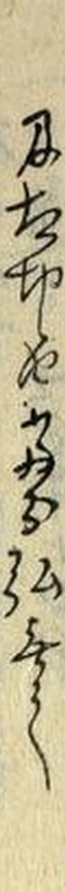及太切之由当分弘無之
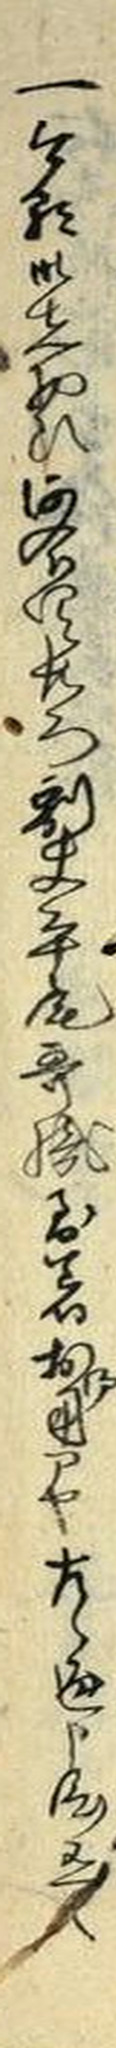一今朝御先物頭河合四郎左衛門副使平尾哥織到着於御用部や左之通申渡有之
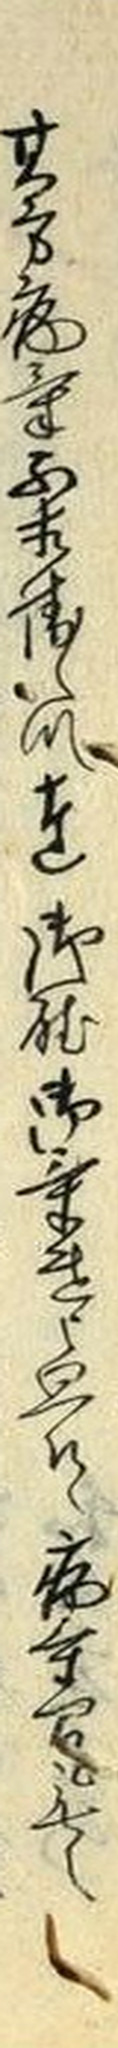其方病気不相勝候段達御聴御気遣被思召候病気間も無之
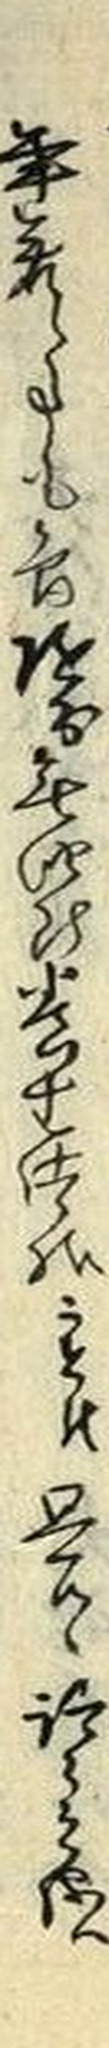年若之事も候間随分無油断養生仕候様ニと被思召候跡々之儀ハ
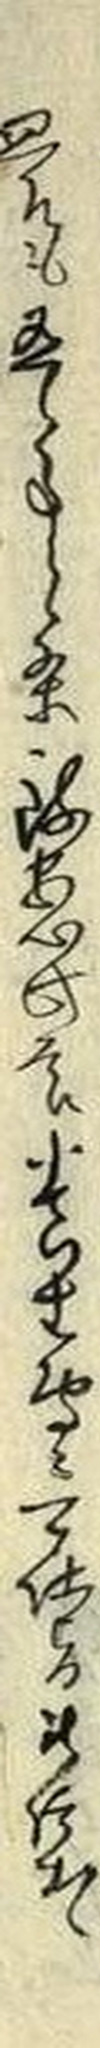思召も有之事ニ候条致安心此節養生専ニ可仕旨被仰出候
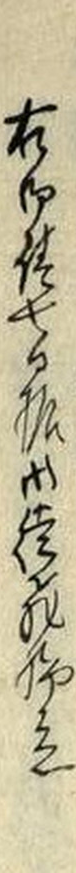右御請七日振御徒飛脚立
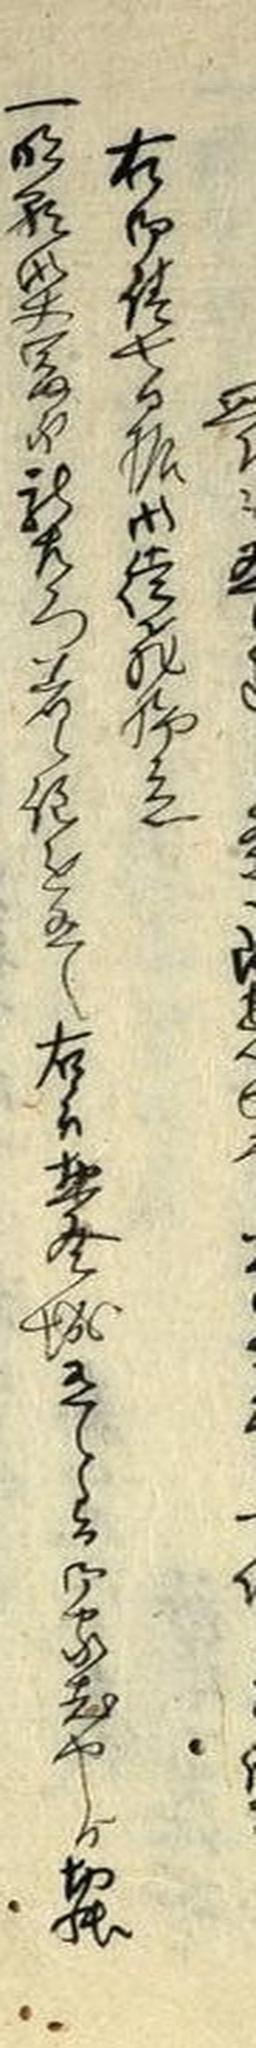一明朝御使富永新左衛門着注進有之右ニ付惣登城有之候旨御家老中ゟ切紙
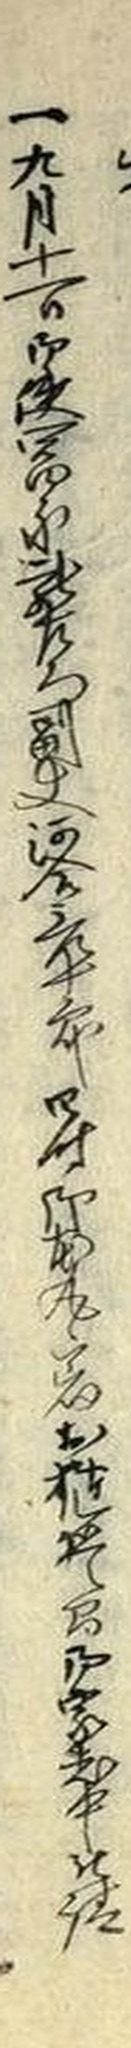一九月十一日御使富永新左衛門副使河合彦十郎四時御本丸着於韃靼之間御家老中被請
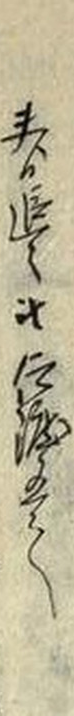夫ゟ追々被仰渡有之
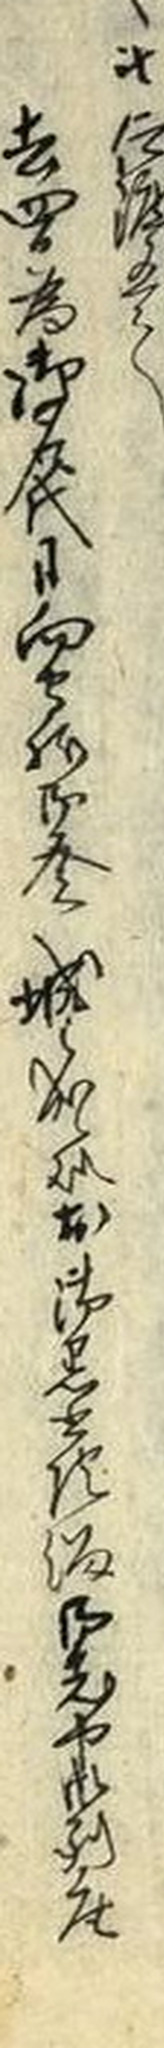去四日為御名代日向守様御登城被成候処於御黒書院側御老中御列座
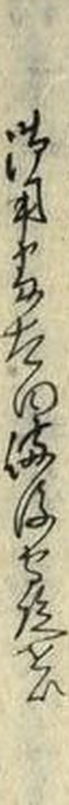御用番太田備後守殿を以
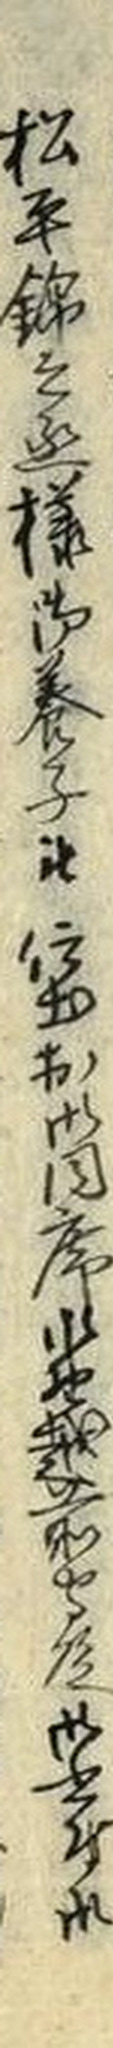松平錦之丞様御養子被仰出於御同席水野越前守殿御書付御
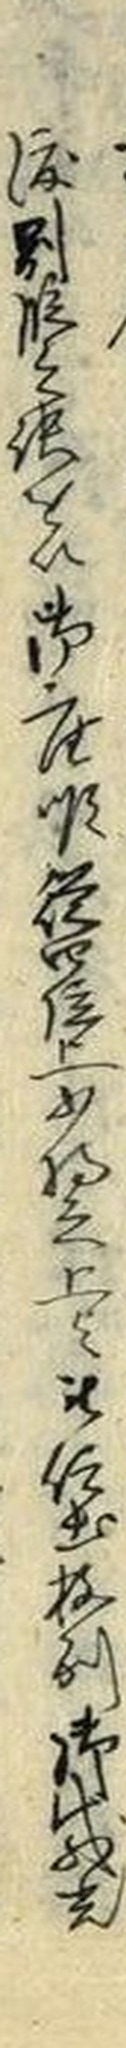渡別段之訳を以御座順従四位上少将之上与被仰出格別御威光
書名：少傅日録抄（斉善付側向頭取日記、江戸并道中、初入在国、逝去後…
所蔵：福井県文書館 Fukui Prefectural Archives
